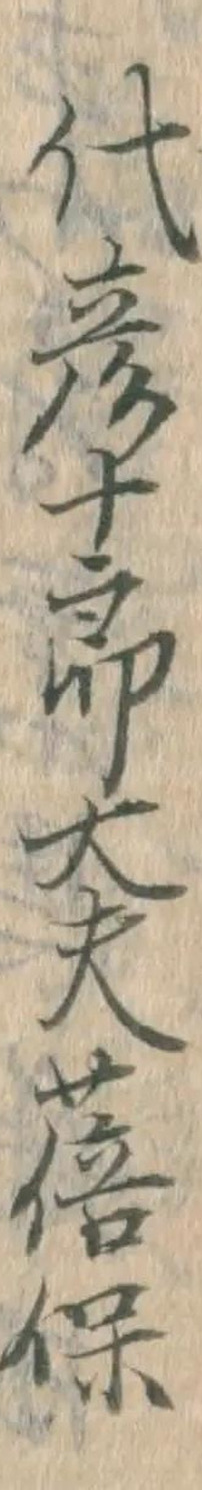代彦十郎大夫蓓保
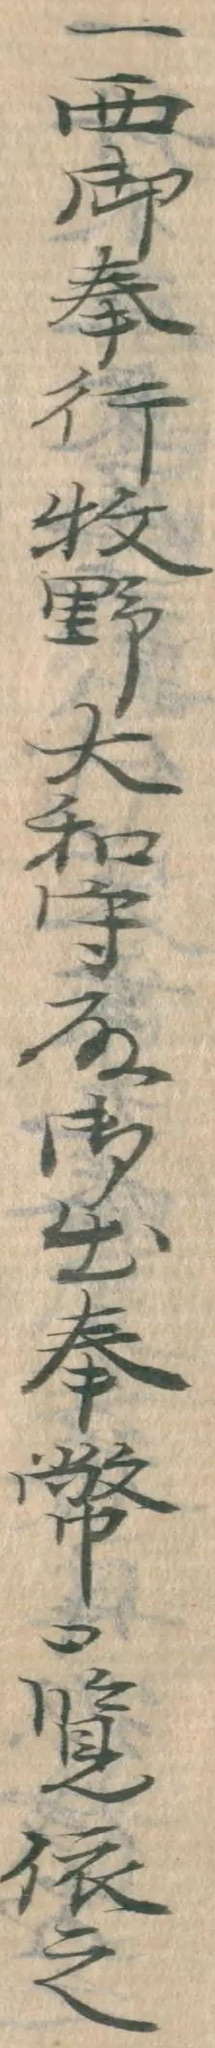一西御奉行牧野大和守殿御出奉幣御覧依之
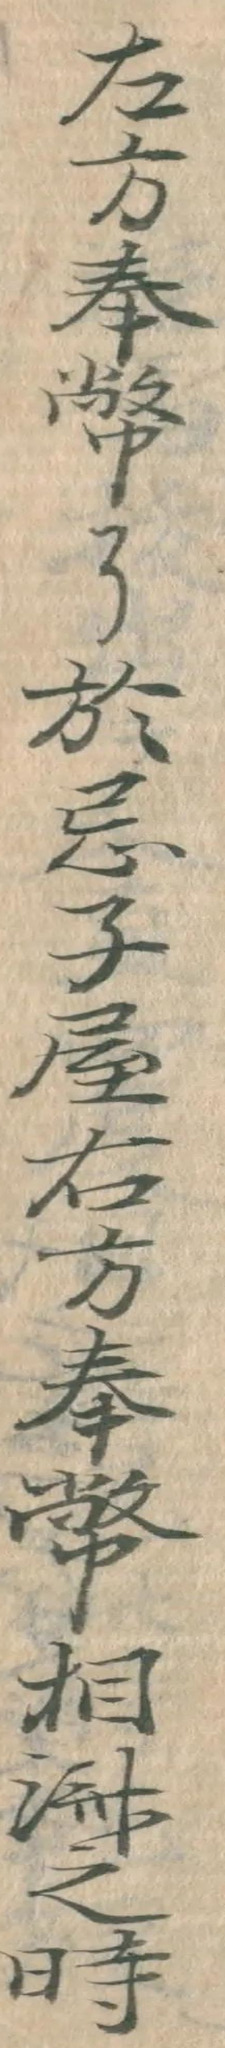左方奉幣了於忌子屋右方奉幣相済之時
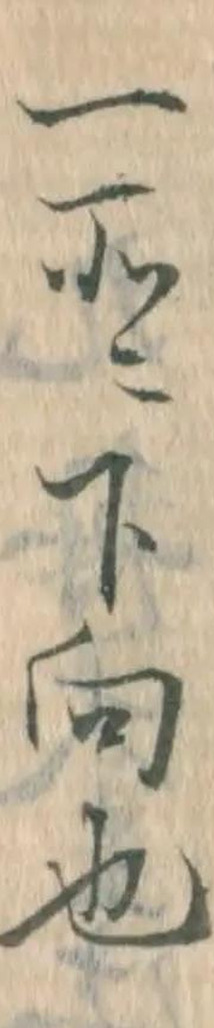一所ニ下向也
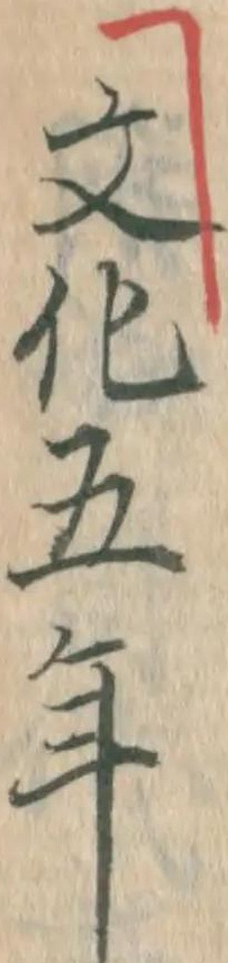文化五年

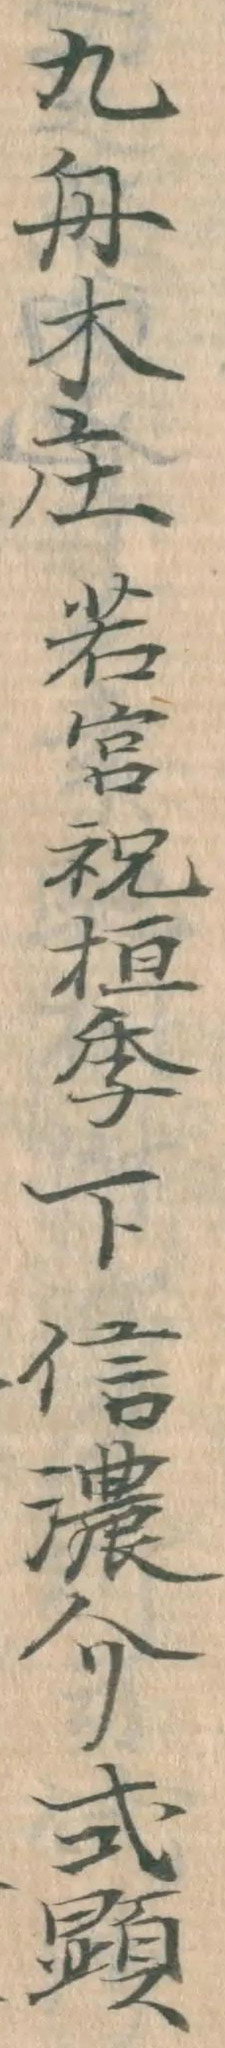九舟木庄若宮祝桓季下信濃介式顕
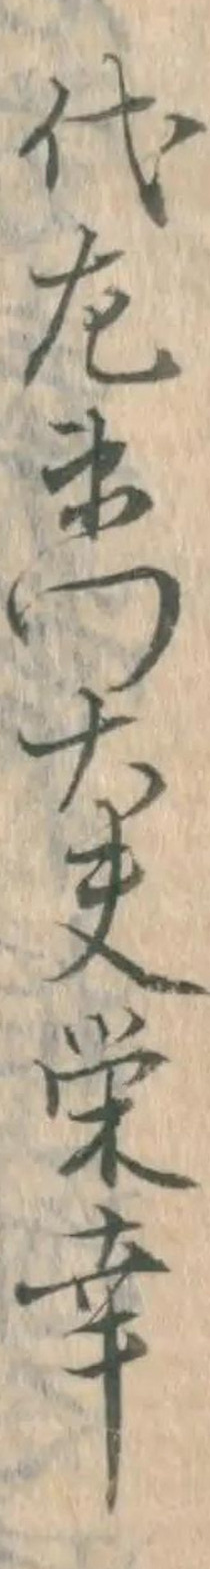代左衛門大夫栄幸
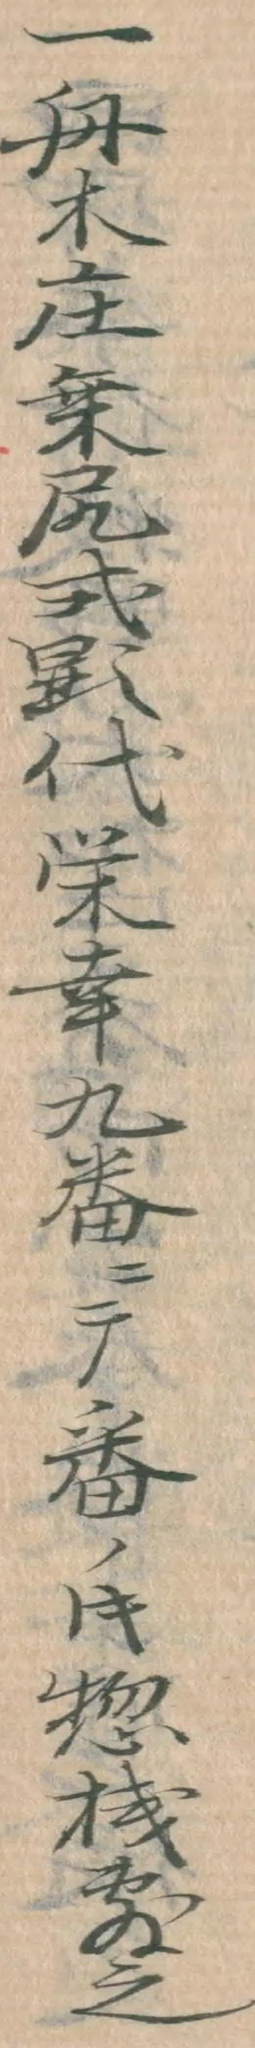一舟木庄乗尻式顕代栄幸九番ニテ番ノトキ惣桟敷之
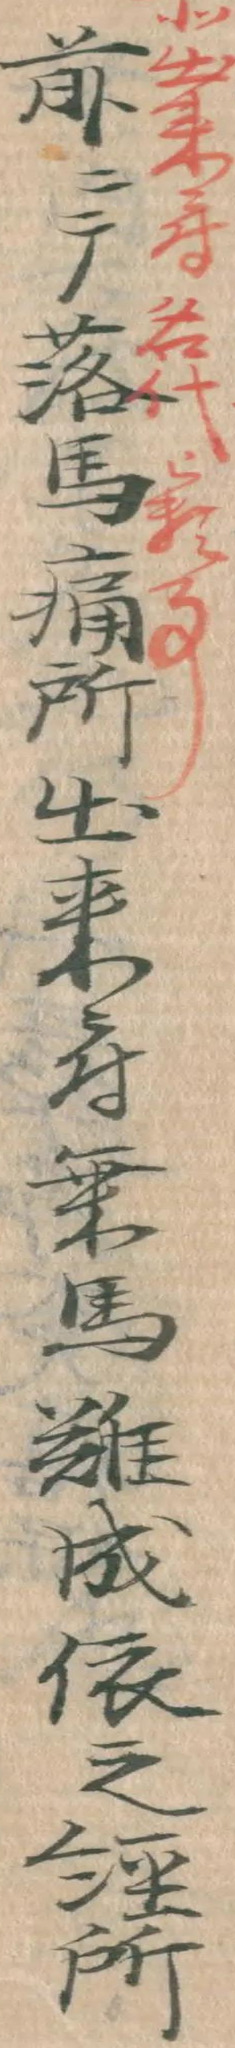前ニテ落馬痛所出来ニ付乗馬難成依之経所
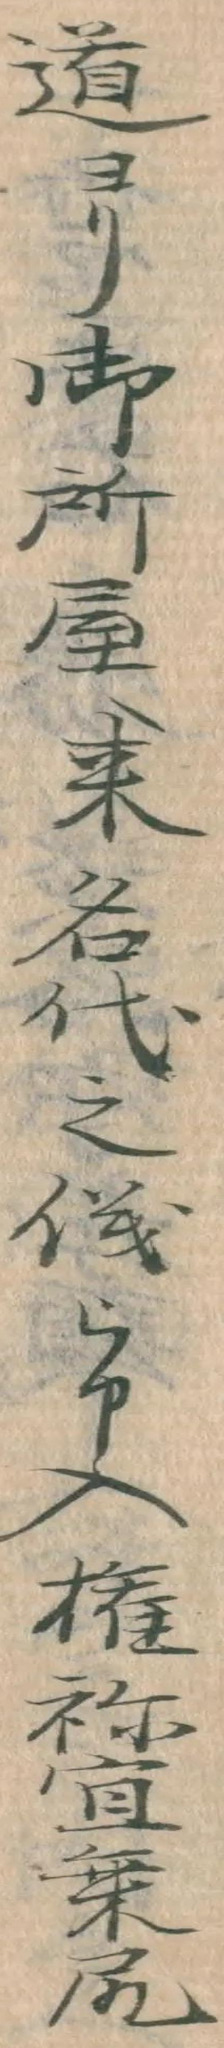道ヨリ御所屋へ来名代之儀被申入権祢宜乗尻
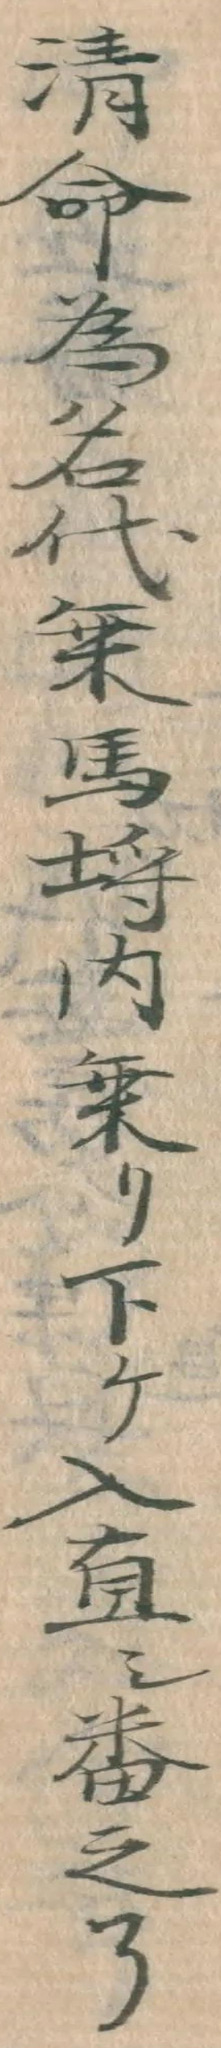清命為名代乗馬埒内乗リ下ケ入直シ番之了
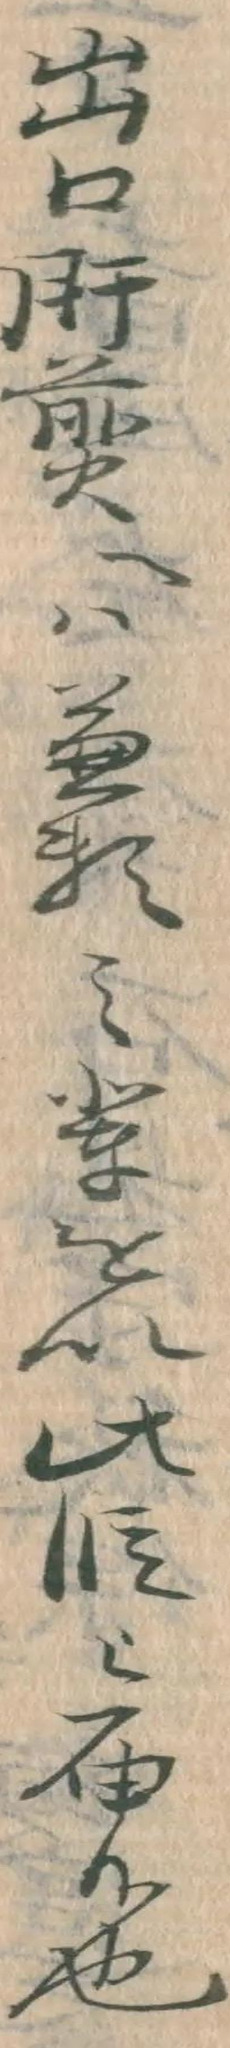出口肝煎ヘハ兼頼之輩を以此段被届候也
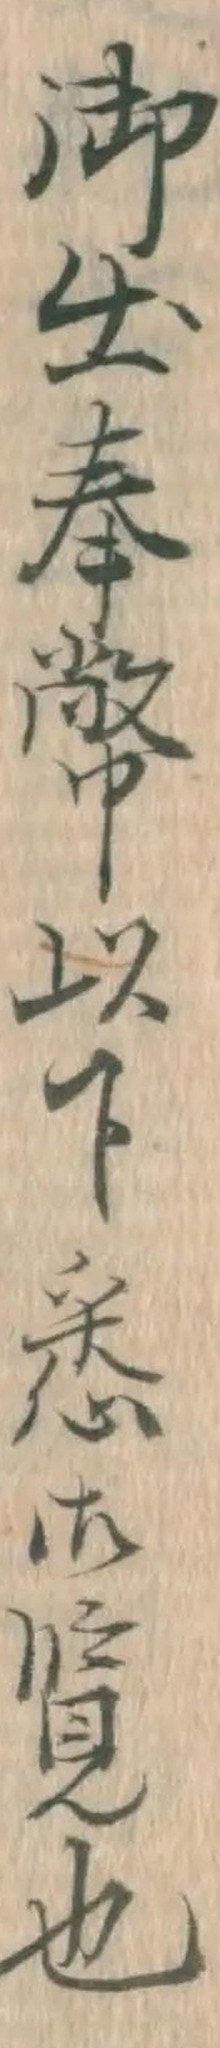御出奉幣以下悉御覧也
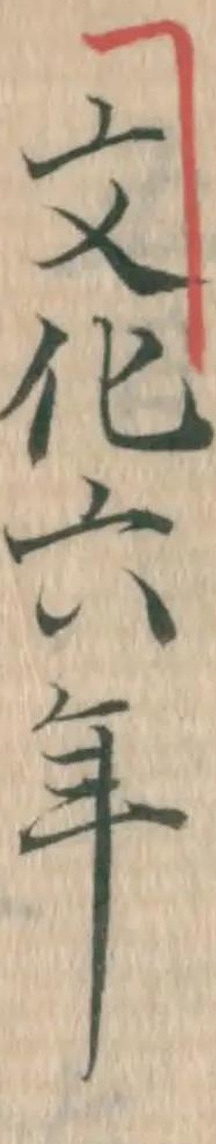文化六年
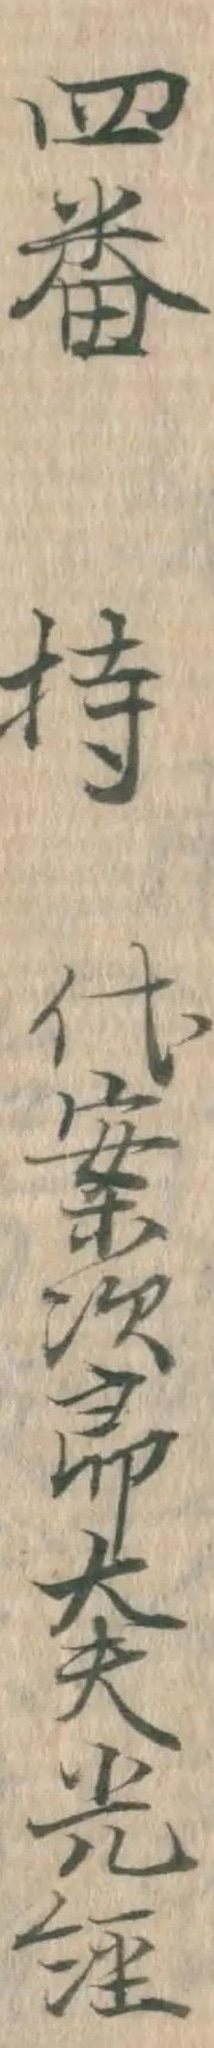四番持代案次郎大夫光経
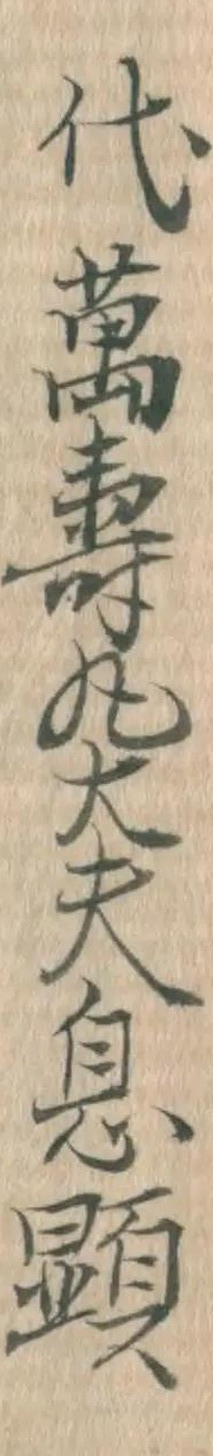代万寿丸大夫息顕
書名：賀茂社記録. 第10冊
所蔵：国立国会図書館 National Diet Library, JAPAN
